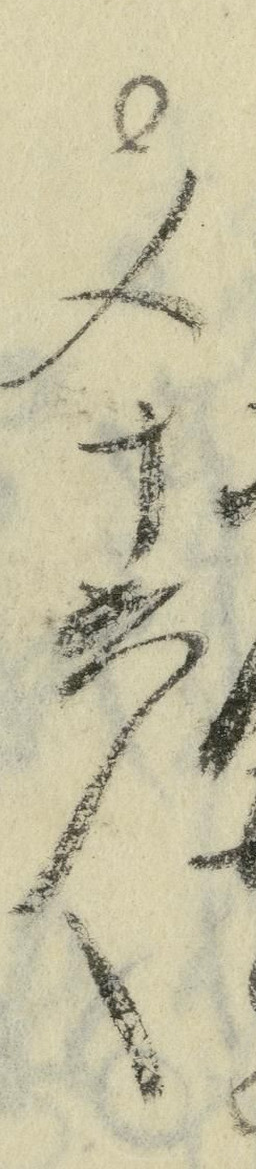〆十六人
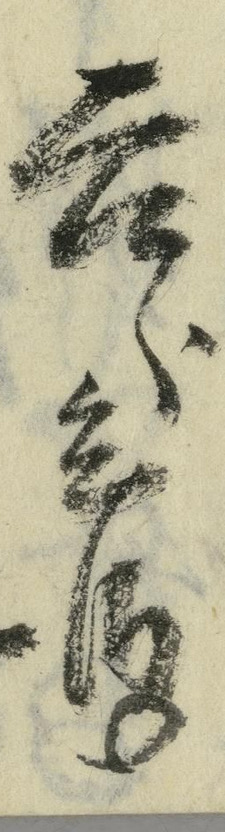兵郎兵衛
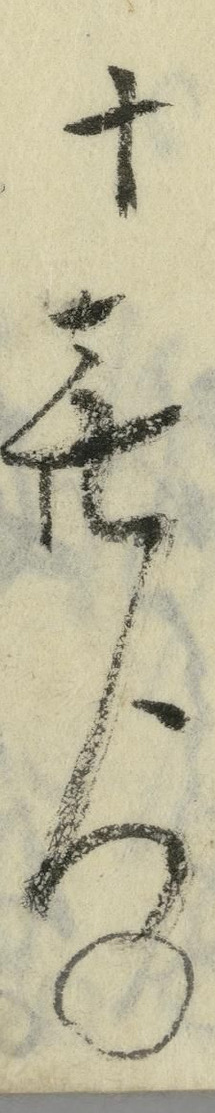十喜右衛門
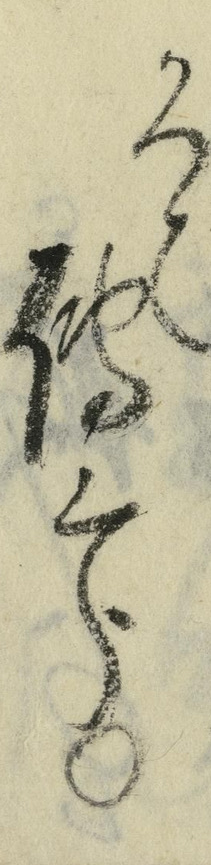伝三郎
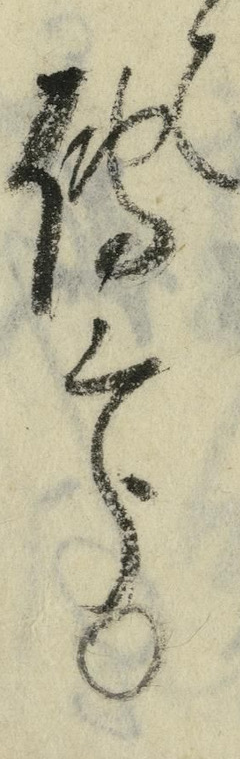庄兵衛
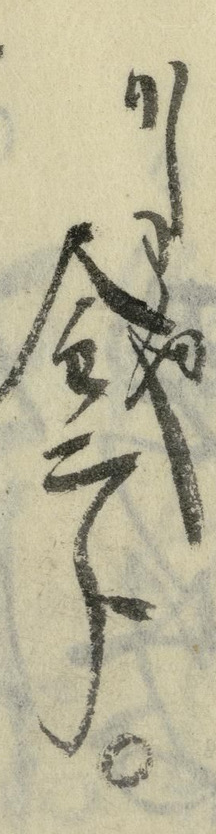金二郎
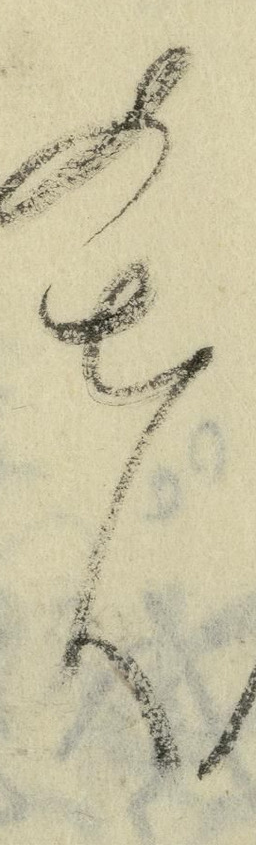〆七人
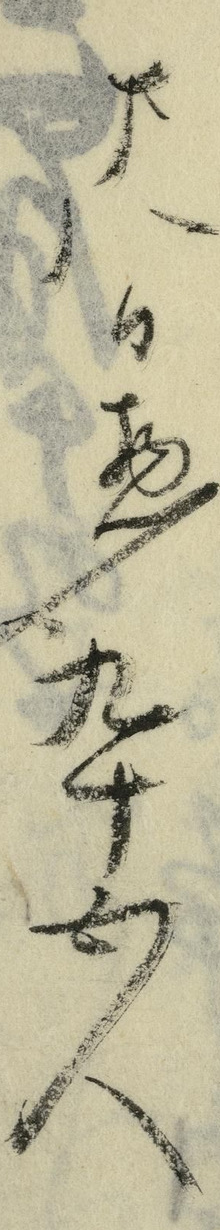十八日惣〆九十五人

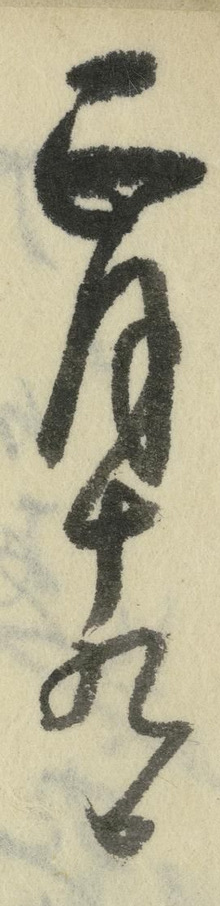正月十九日
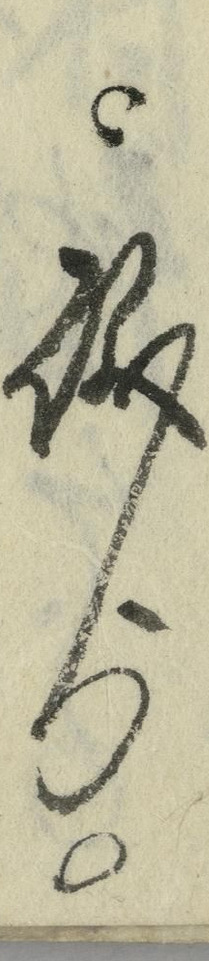十喜右衛門
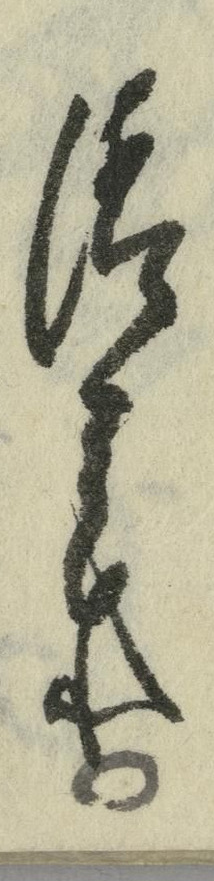清兵衛
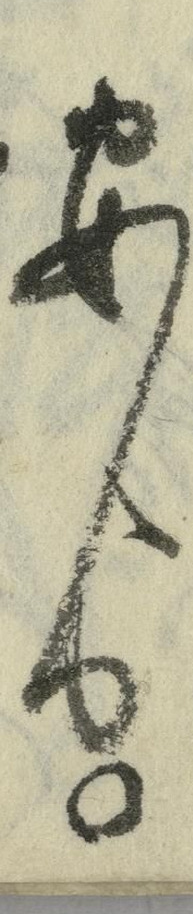安右衛門
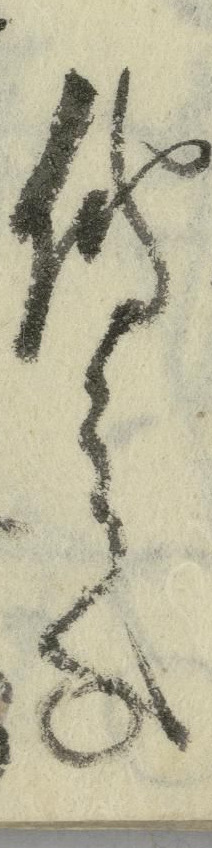伝兵衛
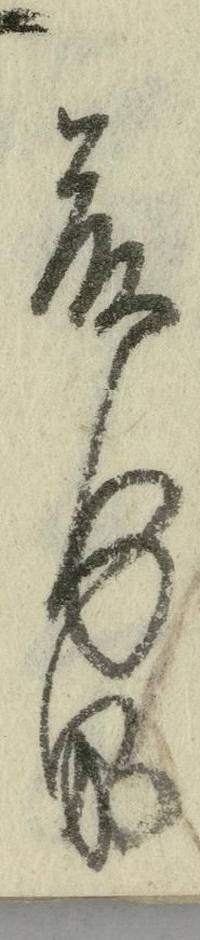清兵衛
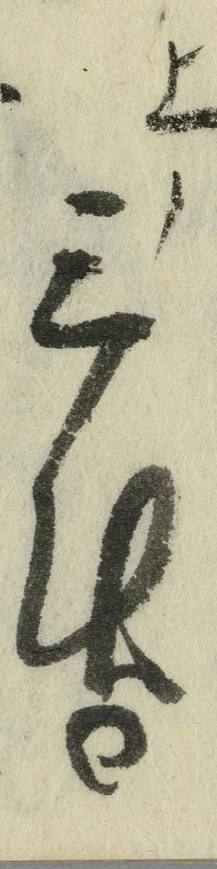清兵衛
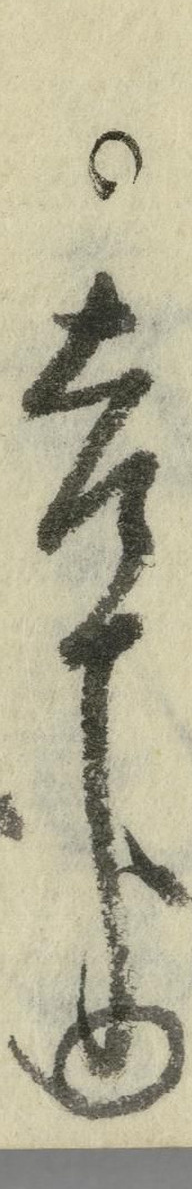儀右衛門
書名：天明淺間噴火ニ関スル書類
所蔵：東京大学地震研究所図書室 Earthquake Research Institute Library, The University of Tokyo, JAPAN
